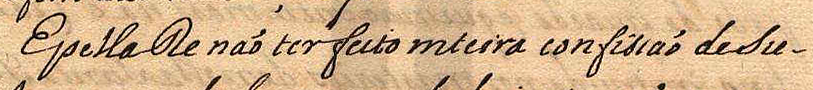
E pella Re naõ ter feito inteira confissaõ de Su
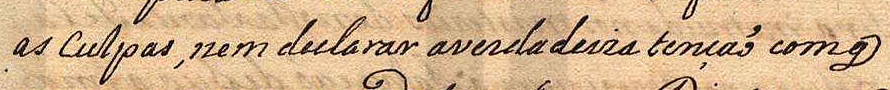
as culpas, nem declarar a verdadeira tençaõ com q̄
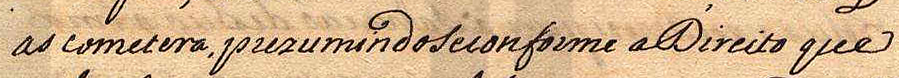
as cometera, prezumindose conforme a Direito que
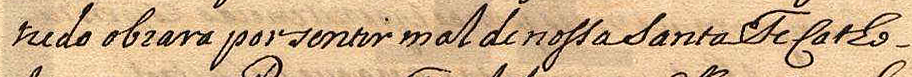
tudo obrara por sentir mal de nossa Santa Fe Catho
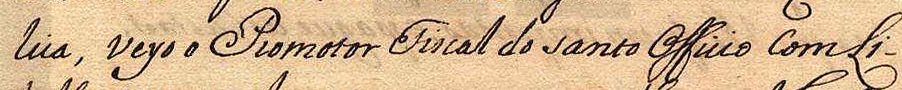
lica, veyo o Promotor Fiscal do santo Officio com Li
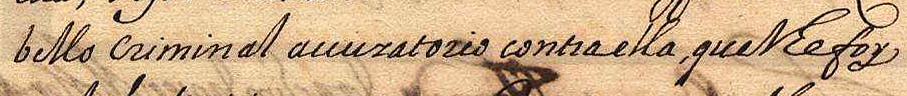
bello criminal accuzatorio contra ella, que lhe foy
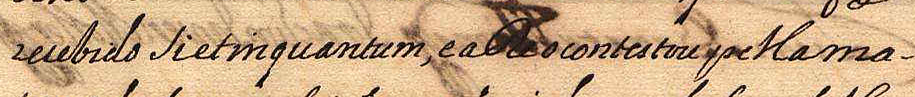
recebido si et in quantum, e a Re o contestou pella ma
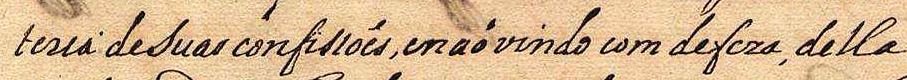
teria de suas confissoẽs, e naõ vindo com defeza, della
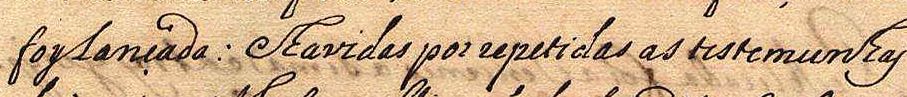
foy lançada: e havidas por repetidas as testemunhas
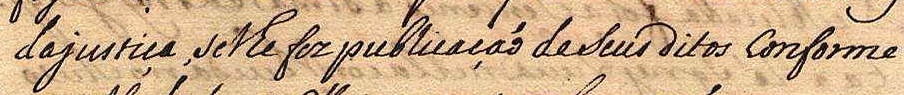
da justiça, se lhe fez publicaçaõ de seus ditos conforme
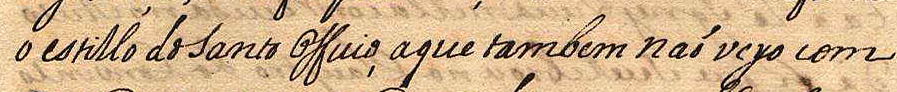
o estillo do Santo Officio, a que tambem naõ veyo com
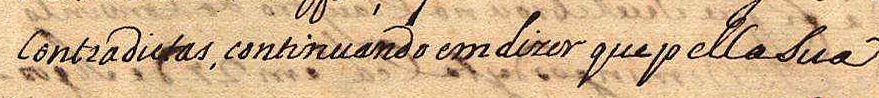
contradictas, continuando em dizer que pella Sua
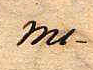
me
